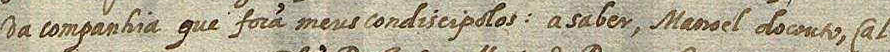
da companhia que forā meus condiscipolos: a saber, Manoel do couto, Cal
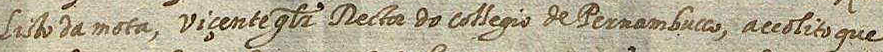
Listo da mota, Viçente ḡlz Rector do collegio de Pernambucco, accolito que
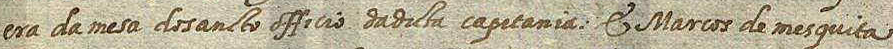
era da mesa do sancto officio da dita capitania: E Marcos de mesquita
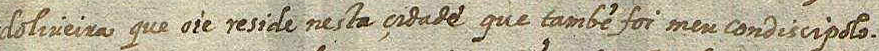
doliueia que oie reside nesta çidade que tambē foi meu condiscipolo.
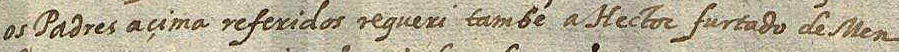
os Padres açima referidos requeri tambē a Hector furtado de Men
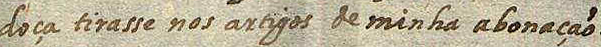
doça tirasse nos artigos de minha abonaçaõ
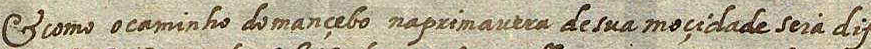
E como o caminho do mançebo na primauera de sua moçidade seia dif
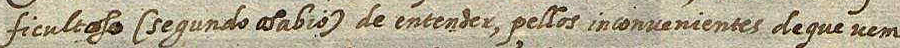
ficultoso (segundo o sabio) de entender, pellos inconuenientes de que uem
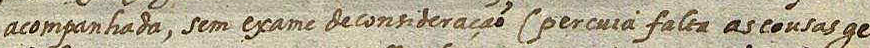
acompanhada, sem exame de consideraçaõ (per cuia falta as cousas ge
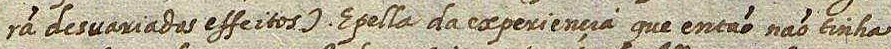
rā desuariados effeitos). E pella da experiençia que entaõ nõ tinha
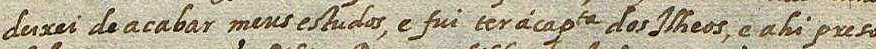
deixei de acabar os meus estudos, e fui ter á capta dos Ilheos, e ahi preso
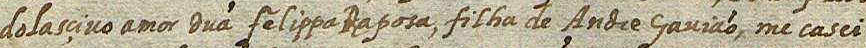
do lasçiuo amor duā Felippa Raposa, filha de Andre Gauião, me casei
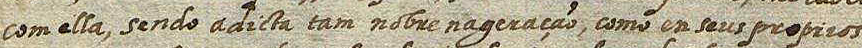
com ella, sendo a dicta tam nobre na geração, como en seus proprios
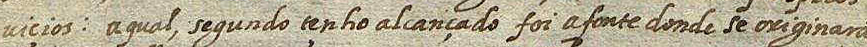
uiçios: a qual, segundo tenho alcançado foi a doente donde se originarā
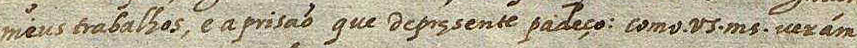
meus trabalhos, e a prisão que de presente padeço: como vs s uerám
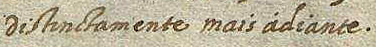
distinctamente mais adiante.
